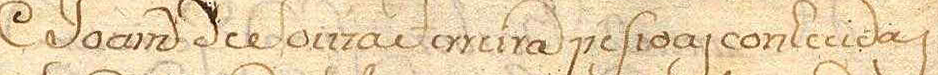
e Joam de Souza Ferreira pessoas conhecidas
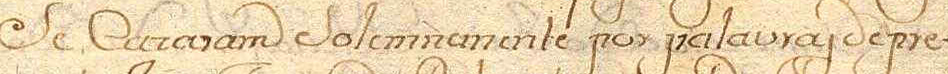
Se Cazaram Solemnemente por palavras de pre
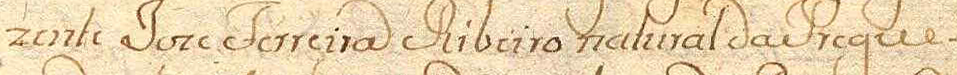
zente Ioze Ferreira Ribeiro natural da Fregue
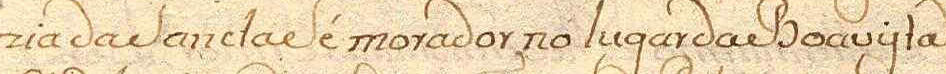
zia da Sancta Sé morador no lugar da Boa vista
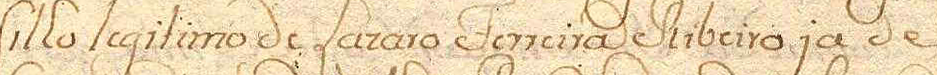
filho legitimo de Lazaro Ferreira Ribeiro ja de
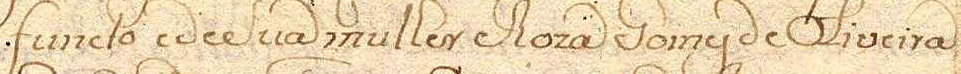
functo e de Sua mulher Roza Gomes de oLiveira
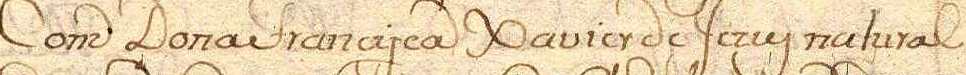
Com Dona Francisca Xavier de Jezus natural
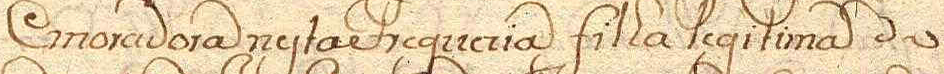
e moradora nesta Freguezia filha legitima do
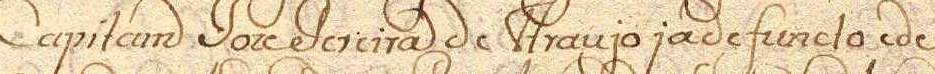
Capitam Ioze Pereira de Araujo ja defuncto e de
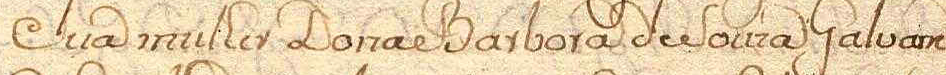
Sua mulher Dona Barbara de Souza Galvam
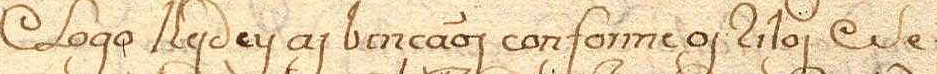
e Logo lhes dey as bençaõs conforme os Ritos e se
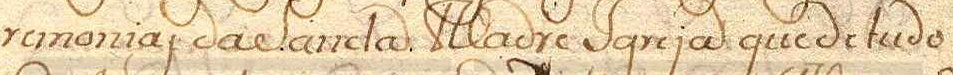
remonias da Sancta Madre Igreja que de tudo
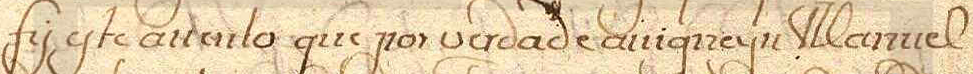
fis este assento que por verdade assigney// Manuel
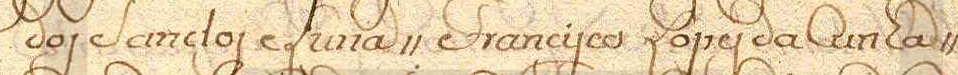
dos Sanctos e Lima// Francisco Lopes da Cunha//
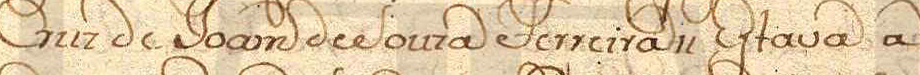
Cruz de Ioam de Souza Ferreira// Estava a
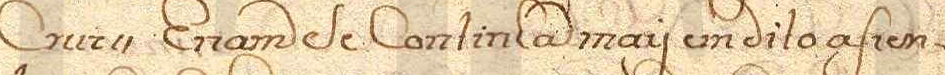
Cruz// E nam se Continha mais em dito assen
